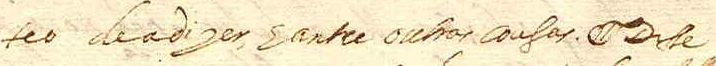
teo de a dizer, E antre outras cousas. ⁋ Disse
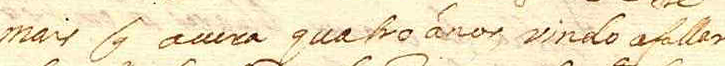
mais q̄ auera quatro ānos vindo a fallar
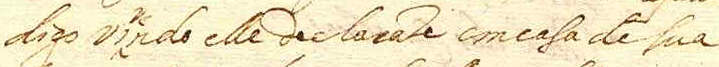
digo vivendo elle declarãte em casa de sua
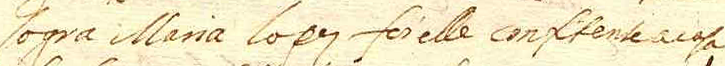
sogra Maria Lopez foi elle confitente a casa
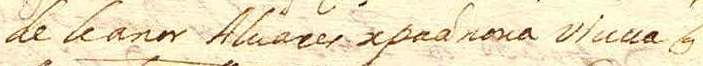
de Leanor Aluares xpaã noua viuua q̄
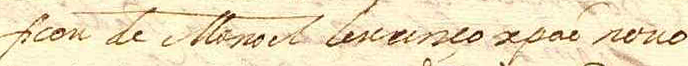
ficou de Manoel Lourenço xpaõ nouo
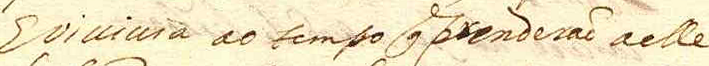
E viuiuia ao tempo q̄ prenderaõ a elle
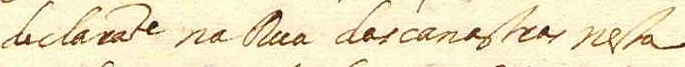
declarãte na Rua das canastras nesta
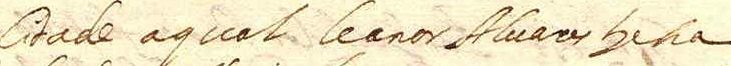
Çidade a qual Leanor Aluares heha
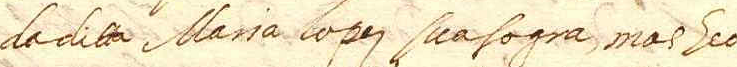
da ditta Maria Lopez sua sogra mas heo
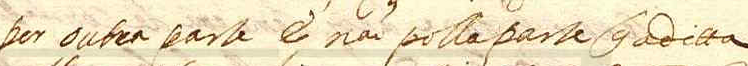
por outra parte & naõ polla parte q̄ a ditta
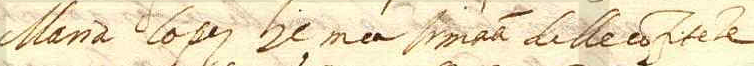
Maria Lopez he mea Jrmaã delle cõfitẽte
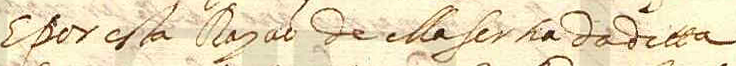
E por esta Razaõ de ella ser ha da ditta
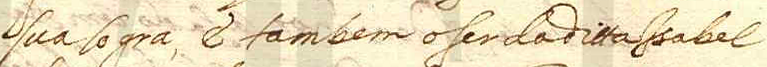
sua sogra, & tambem o ser da ditta Jsabel
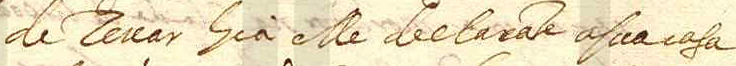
de Touar hia elle declarãte a sua casa
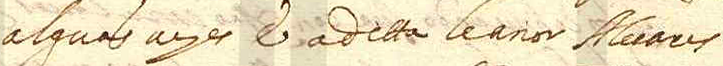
alguas̄ uezes & a ditta Leanor Aluares
